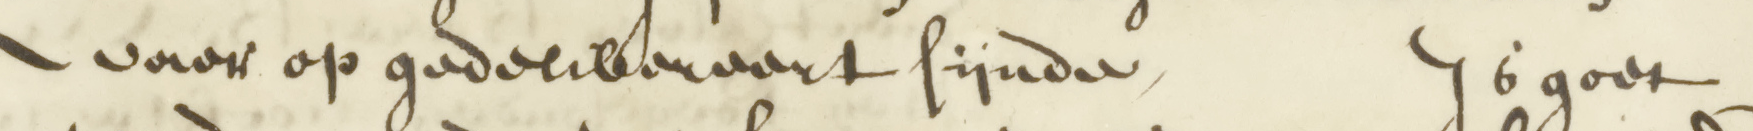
Waer op gedelibereert sijnde, Is goet
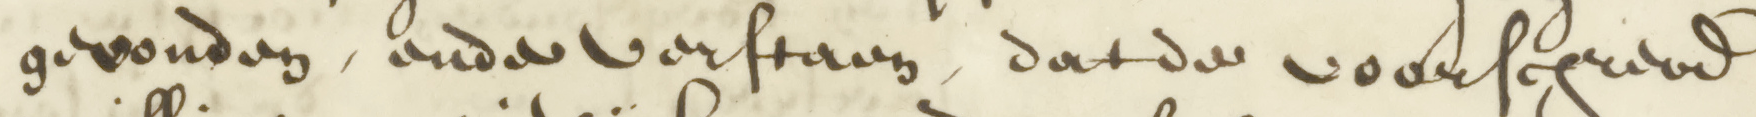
gevonden, ende verstaen, dat de voorschreve
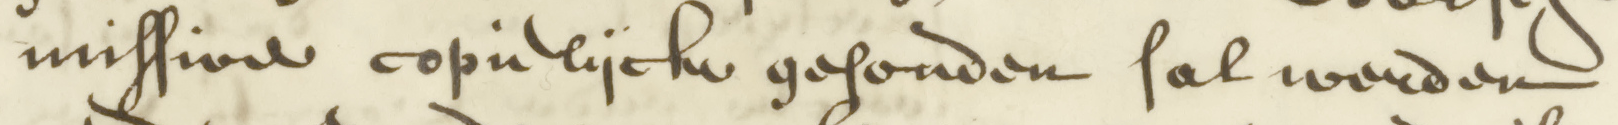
missive copielijck gesonden sal worden
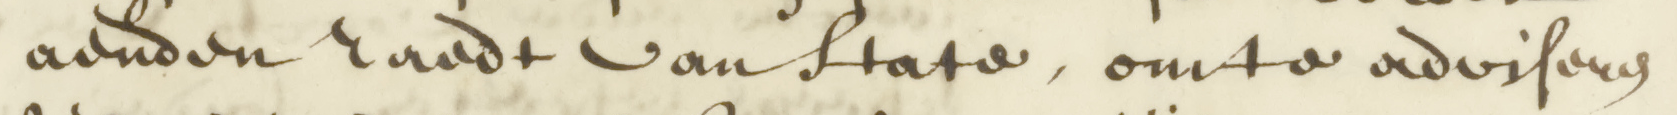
aenden raedt van State, om te adviseren
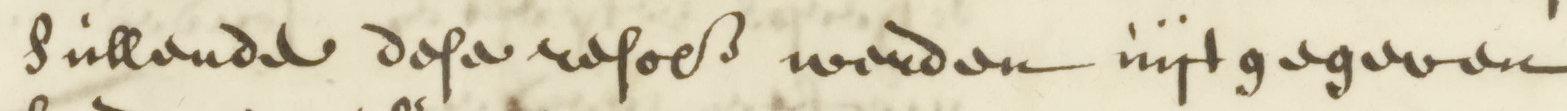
sullende dese resol werden uijtgegeven
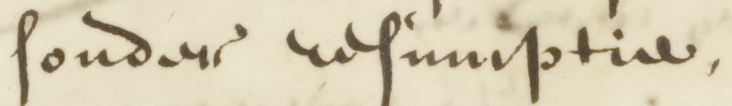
sonder resumptie.
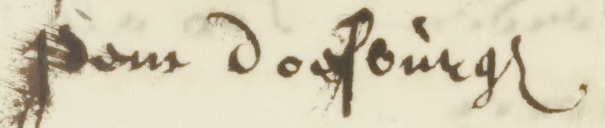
Pont Doesburgh
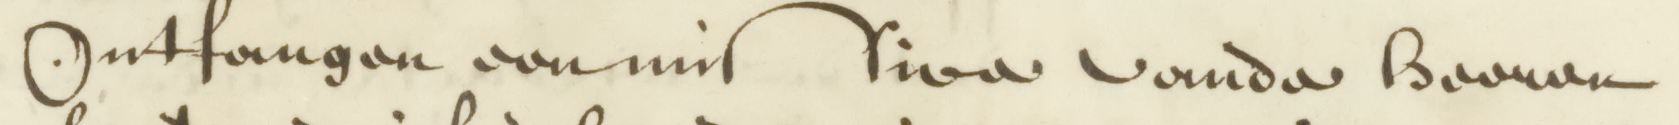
Ontfangen een missive vande heeren
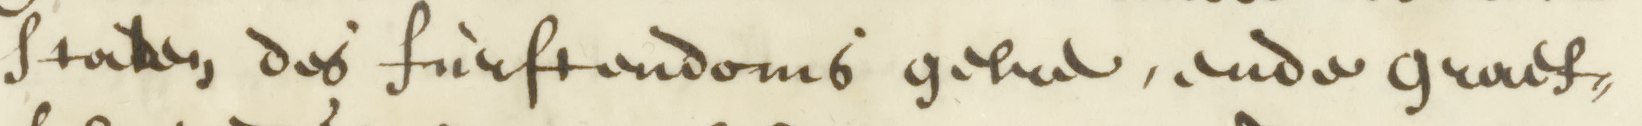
Staten des furstendoms Gelre, ende graef„
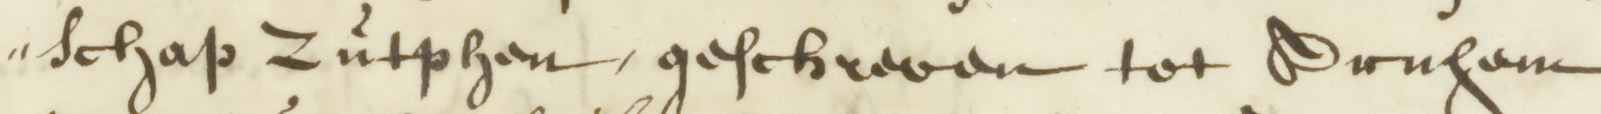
schap Zutphen, geschreven tot Arnhem
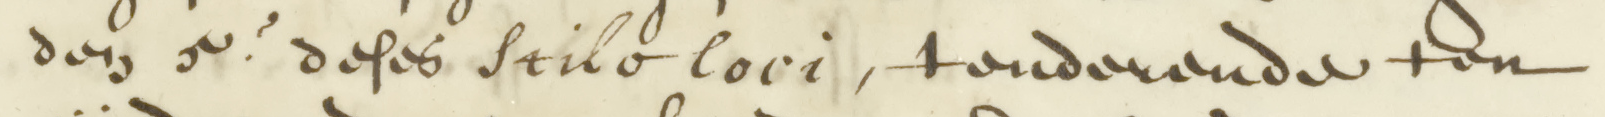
den 5e deses stilo loci, tenderende ten
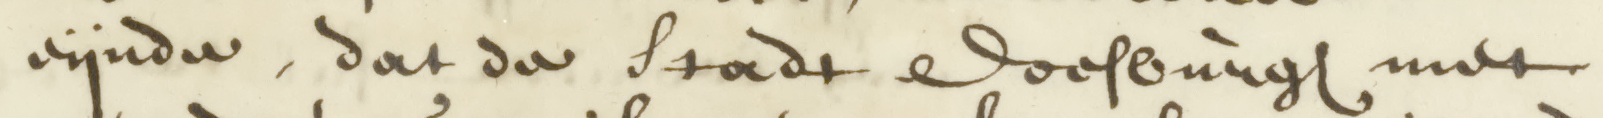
eijnde, dat de Stadt Doesburgh met
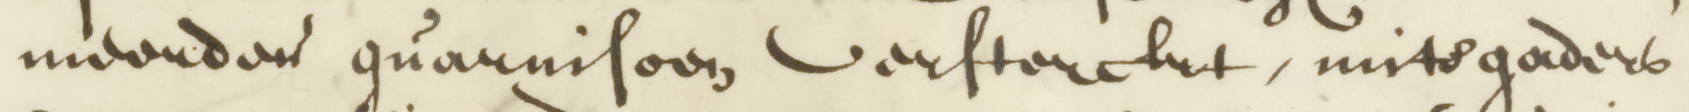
meerder quarnisoen versterckt, mitsgaders
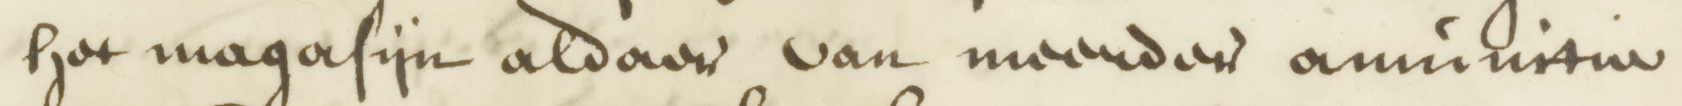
het magasijn aldaer van meerder amunitie
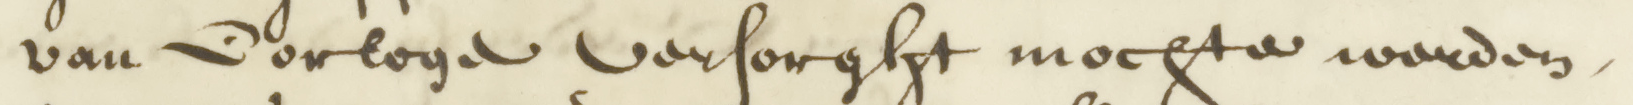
van Oorloge versorght mochte werden,
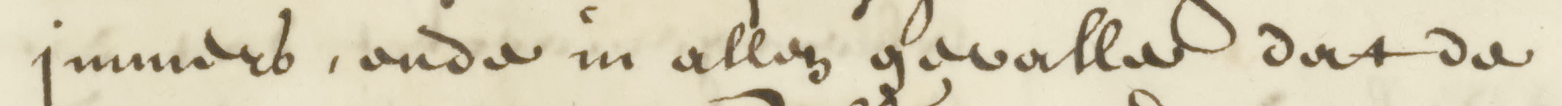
immers, ende in allen gevalle dat de
